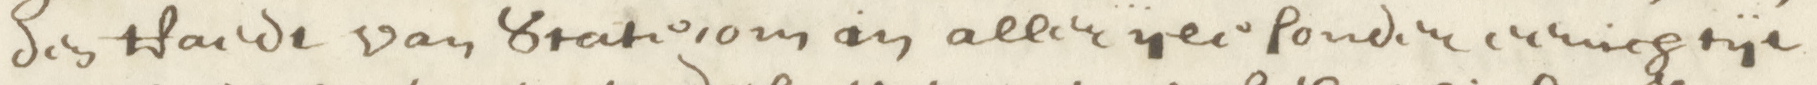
den Raedt van State, om in aller ijle sonder eenich tijt
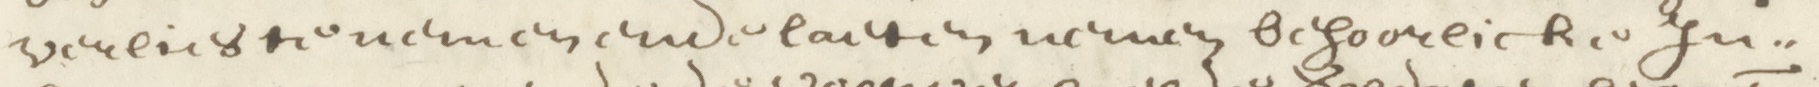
verlies te nemen ende laeten nemen behoorlicke In,,
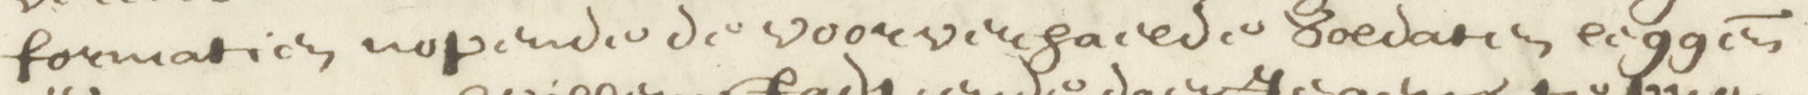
formatien nopende de voorverhaelde Soldaten leggen
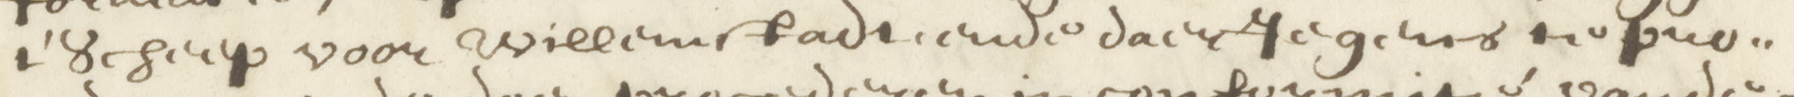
t' Scheep voor willemstadt, ende daer Jegens te pro,,
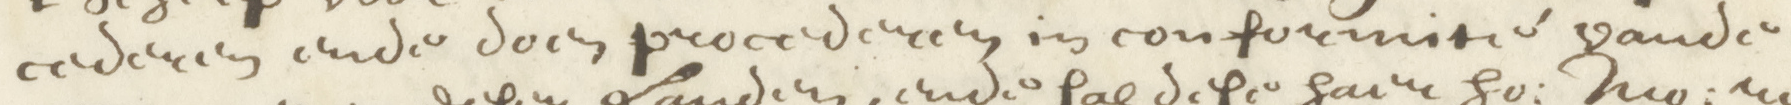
cederen ende doen procederen in conformité vande
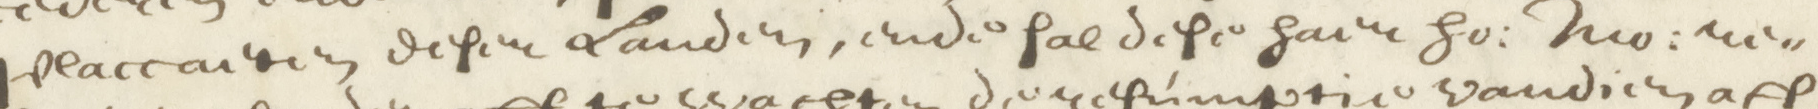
Placcaeten deser Landen, ende sal dese haer ho:Mo: re,,
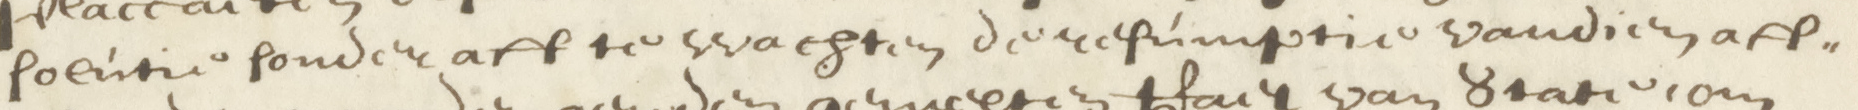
solutie sonder aff te wachten de resumptie vandien aff,,
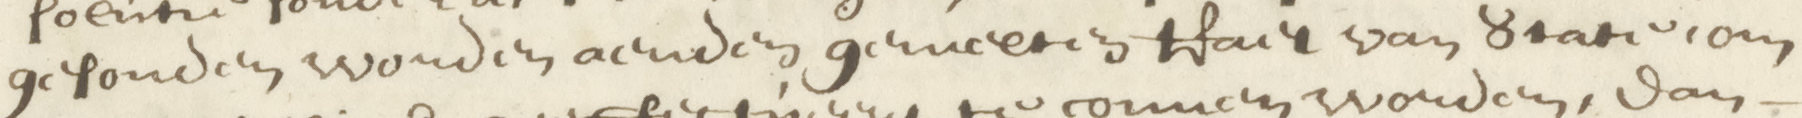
gesonden worden aenden gemelten Raet van State, om
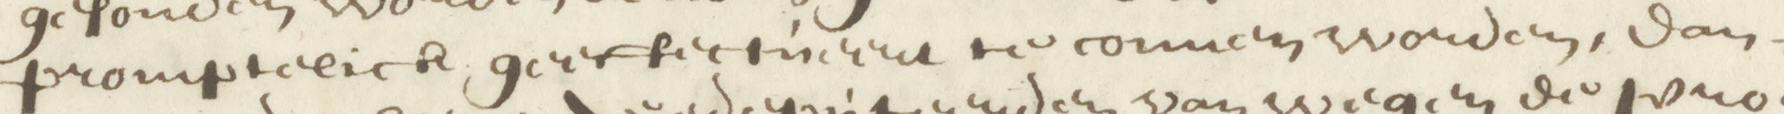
promptelick geeffectueert te connen worden. Dan
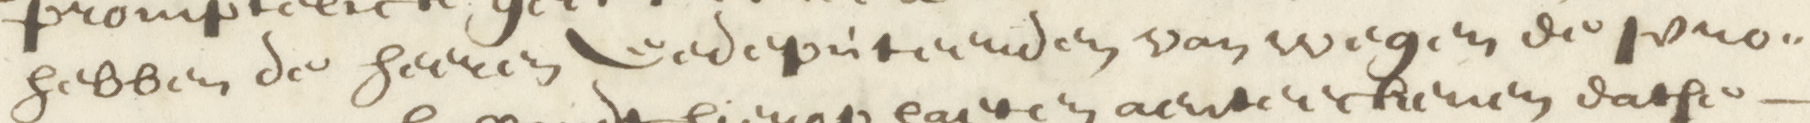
hebben de heeren Gedeputeerden van wegen de Pro,,
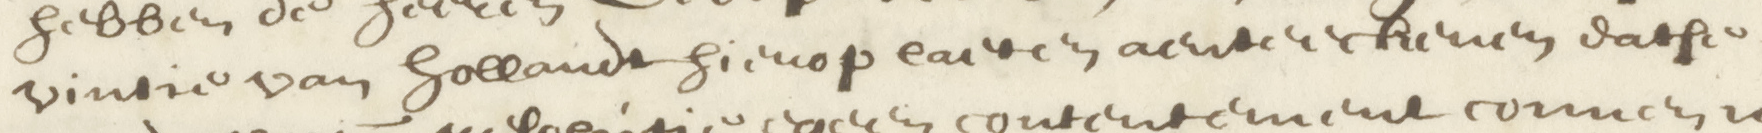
vintie van hollandt hierop laeten aenteeckenen datse
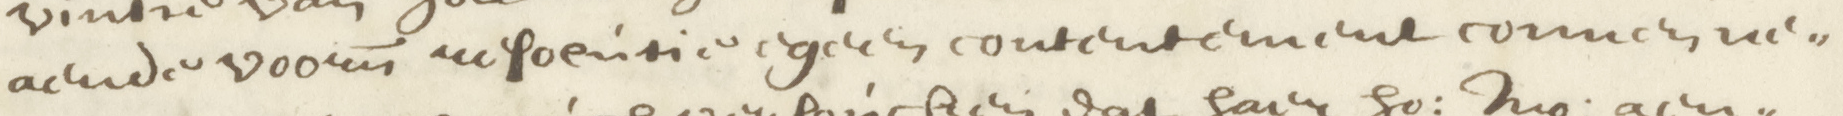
aende voorn resolutie egeen contentement connen ne,,
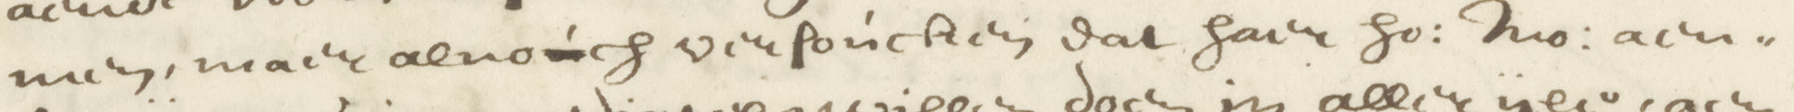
men, maer alnoch versoucken dat haer ho:Mo: aen,,
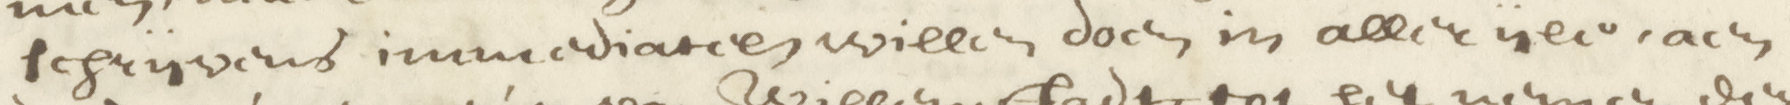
schrijvens immediatel willen doen in aller ijle, aen
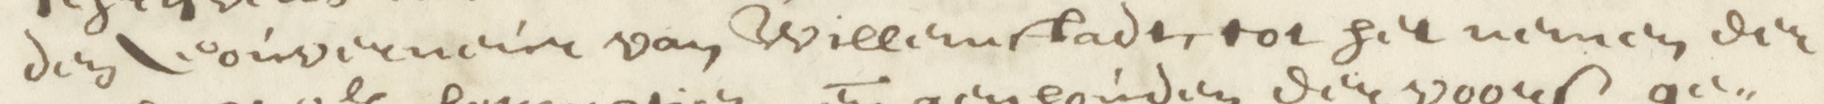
den Gouverneur van Willemstadt, tot het nemen der
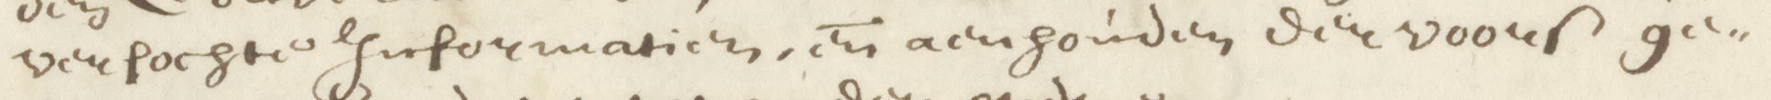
versochte Informatien, en aenhouden der voors ge,,
